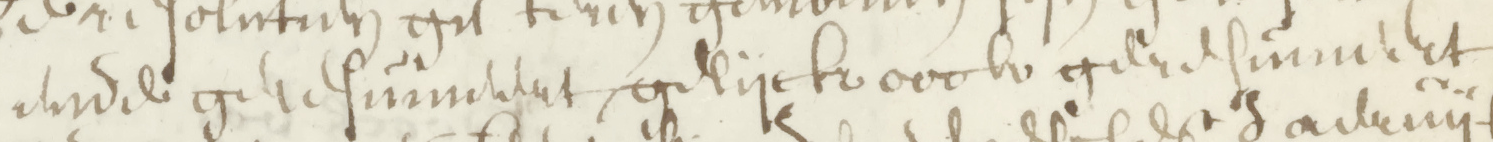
ende geresumeert, gelijck oock geresumeert
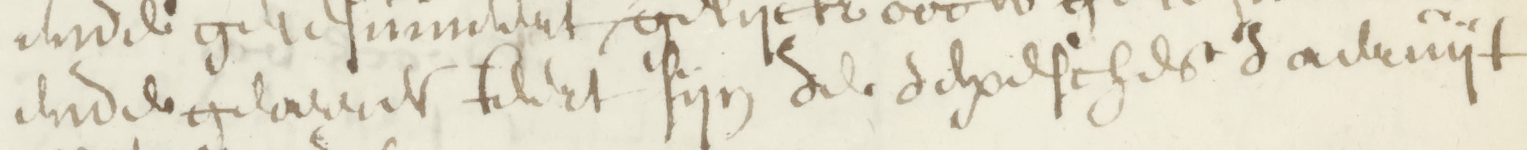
ende gearresteert sijn de depesches daeruijt
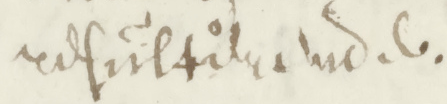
resulterende.
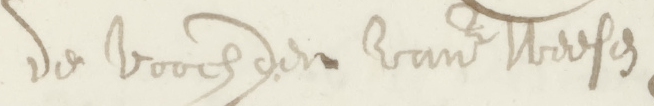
de voochden van Weesen
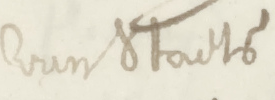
van Staets
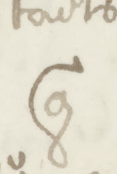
ca.
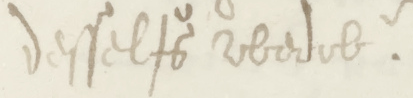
desselfs wedwe.
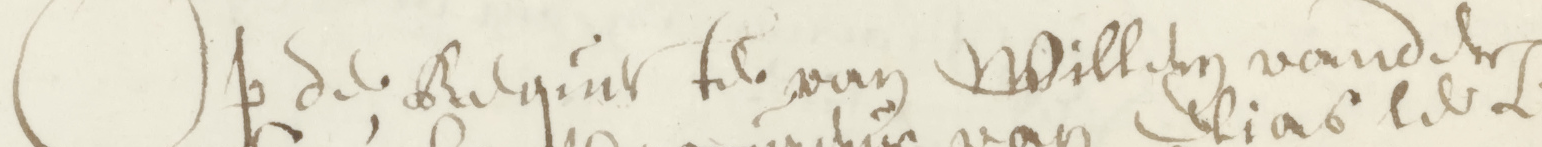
Opde Requeste van Willem vander
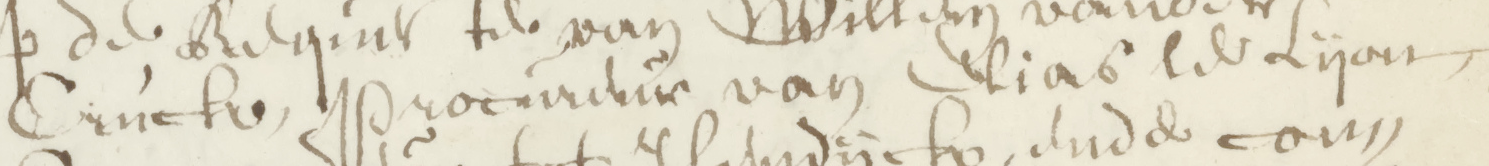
Cruck, Procureur van Elias le Lijon,
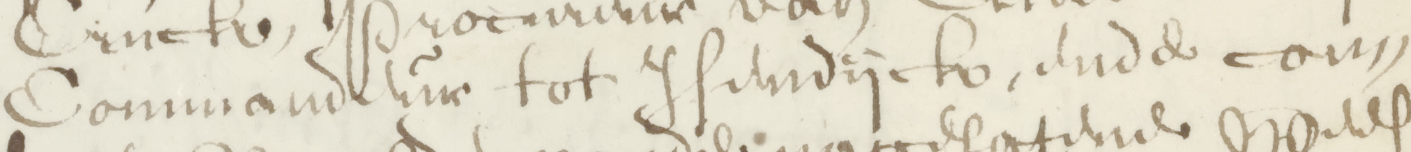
Commandeur tot Isendijck, ende con„
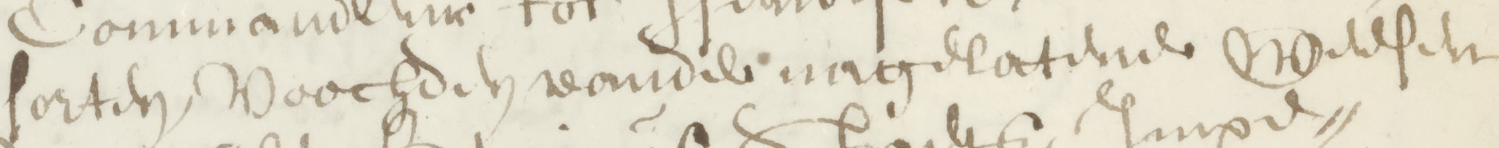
sorten, Voochden vande nagelatene Weesen
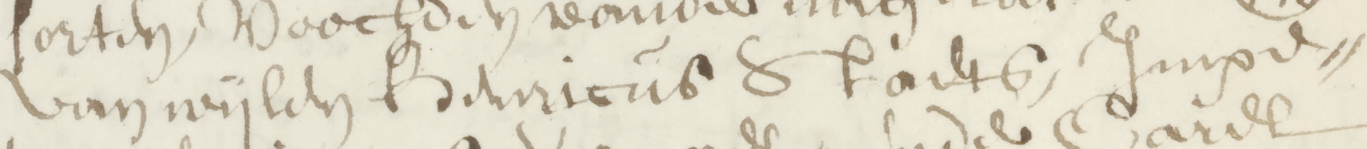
van wijlen Henricus Staets, Impe„
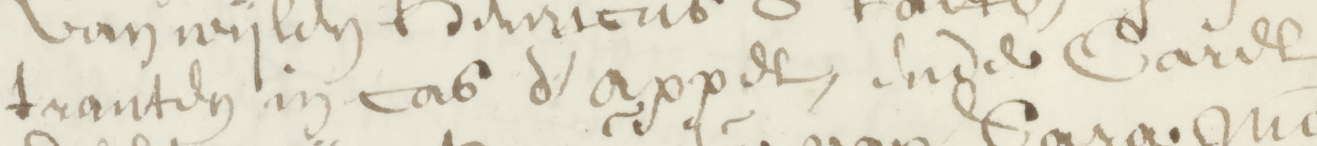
tranten in cas d'appel, ende Carel
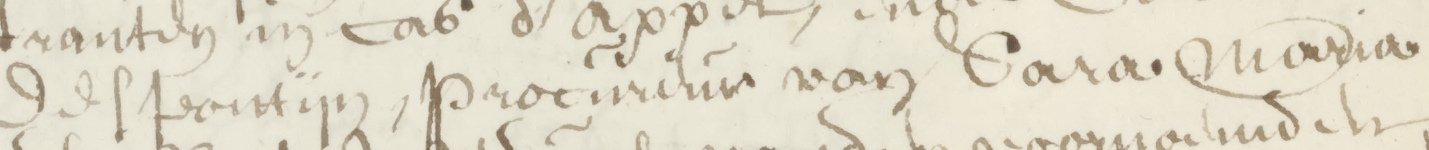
Despontijn, Procureur van Sara Maria
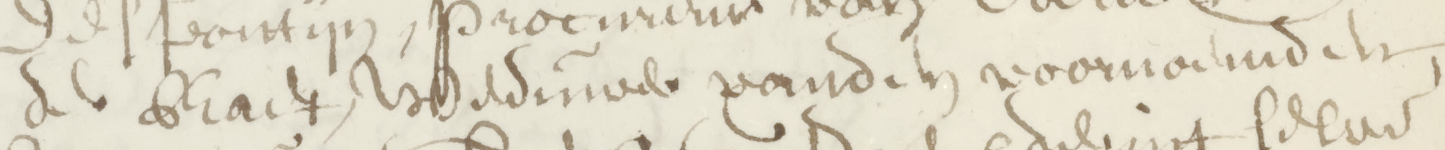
de Raet, Weduwe vanden voornoemden
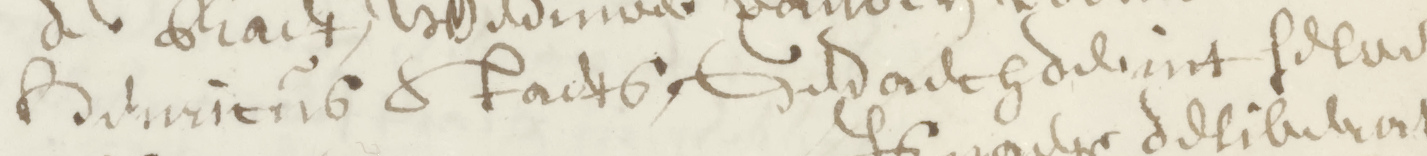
Henricus Staets Gedaechde int selve
